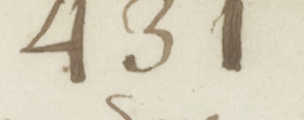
431
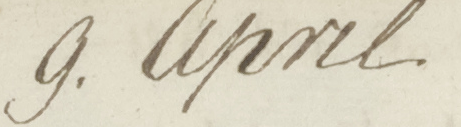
9. April.
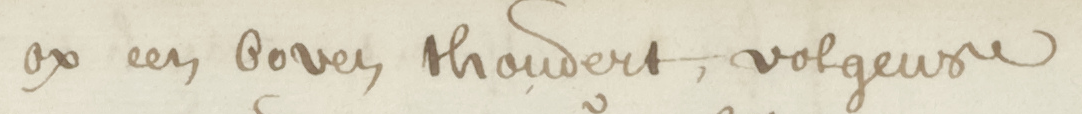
op een boven thondert, volgens
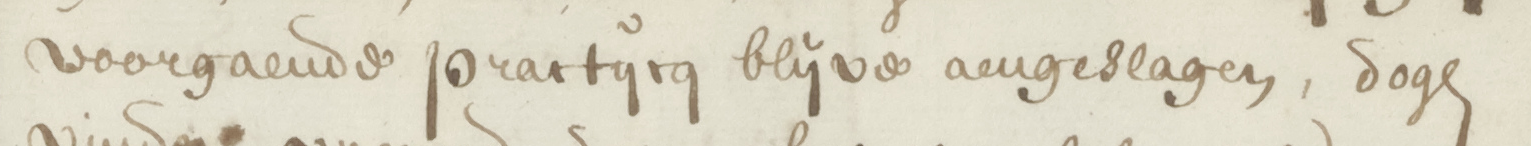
voorgaende practijcq blijve aengeslagen, dogh
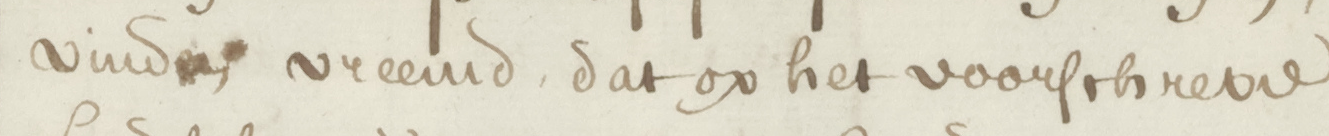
vinden vreemd, dat op het voorschreve
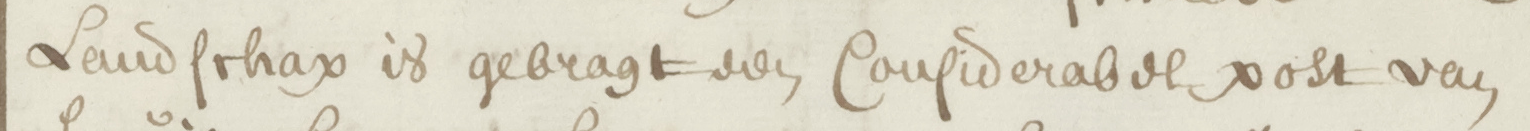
Landschap is gebragt een Considerabel post van
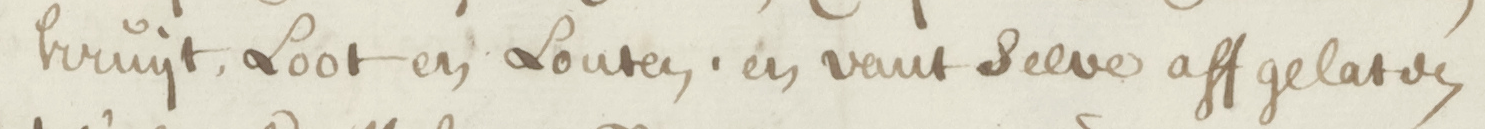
kruijt, Loot en Lonten, en van‛t selve affgelaten
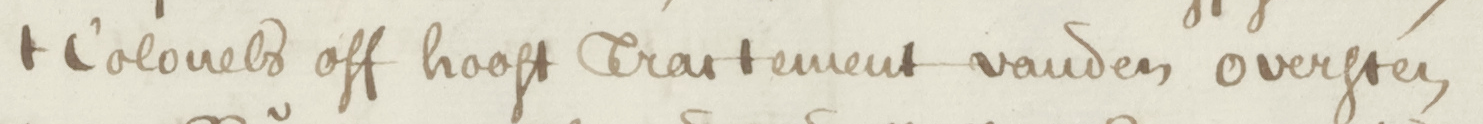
‛t Colonels off hooft Tractement vanden oversten
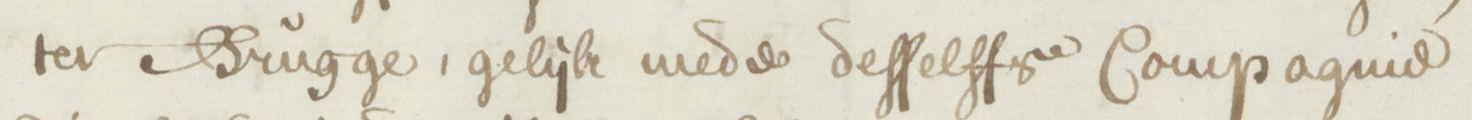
ter Brugge, gelijk mede desselffse Compagnie
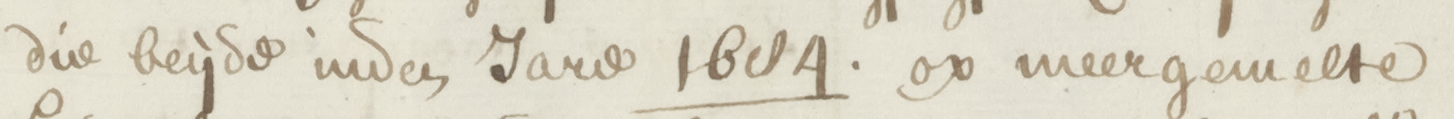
die beijde inden Jare 1684. op meergemelte
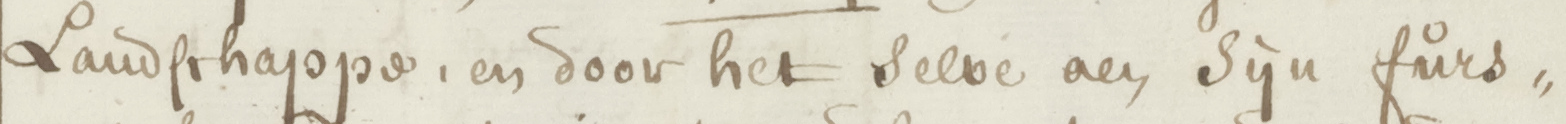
Landschappe, en door het selve aen sijn furs,
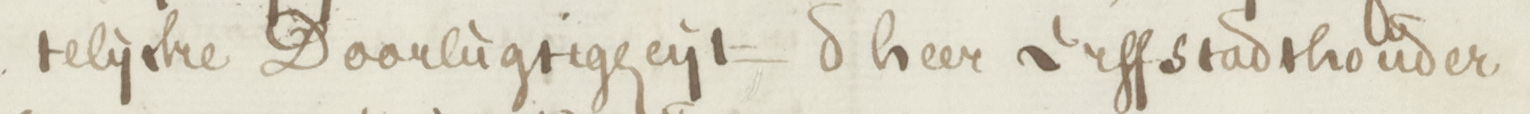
telijcke Doorlugtigheijt d'heer Erffstadthonder
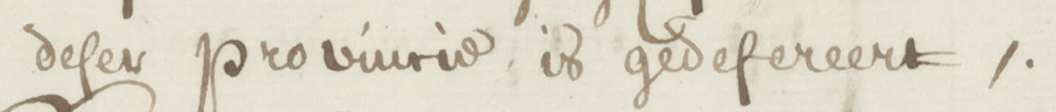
deser provincie, is gedefereert.
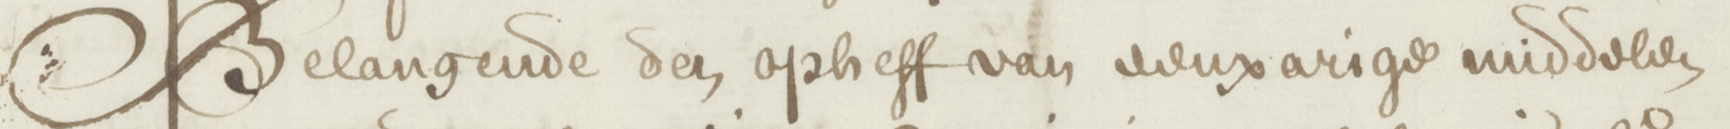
Belangende den opheff van eenparige middelen
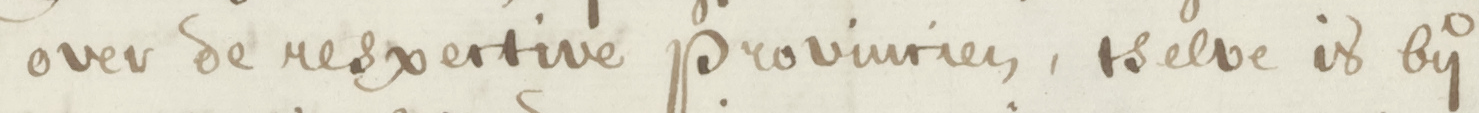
over de respective provincien, tselve is bij
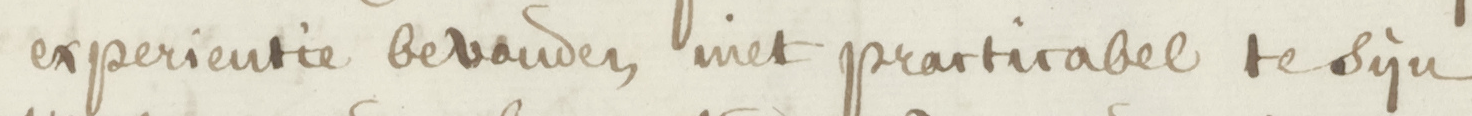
experientie bevonden niet practicabel te sijn
